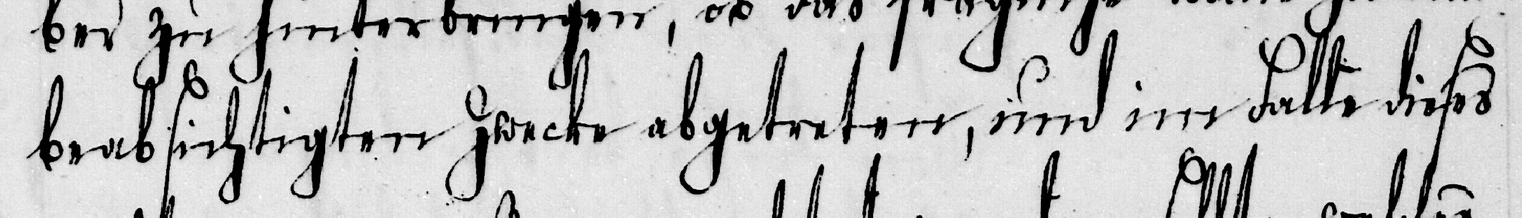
beabsichtigten Zwecke abgetreten, und im Falle dieses
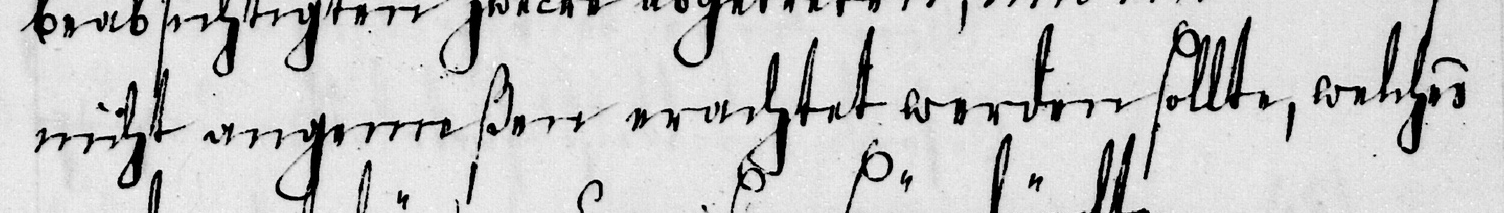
nicht angemeßen erachtet werden sollte, welches
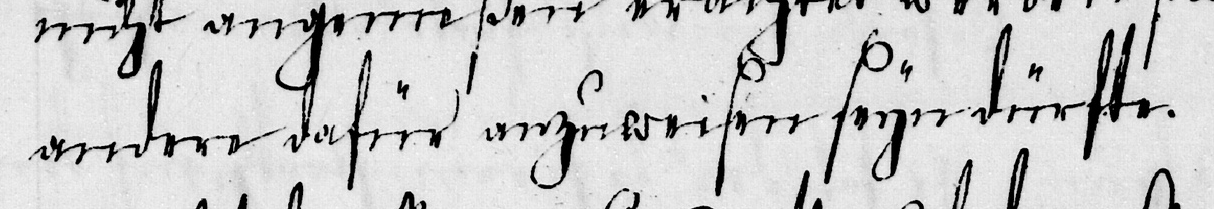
andere dafür anzuweisen seyn dürfte.
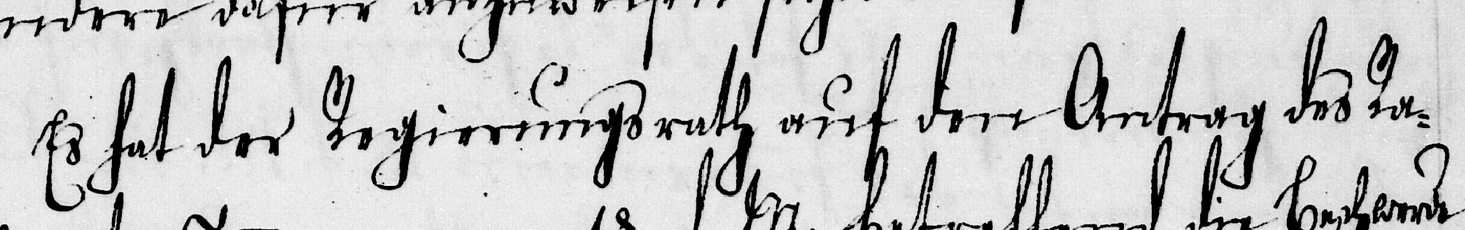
Es hat der Regierungsrath auf den Antrag des Ra¬
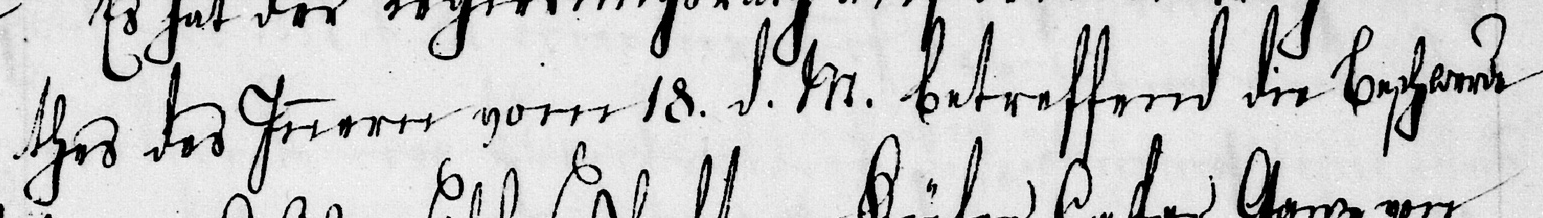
thes des Innern vom 18. d. M. betreffend die Beschwerde
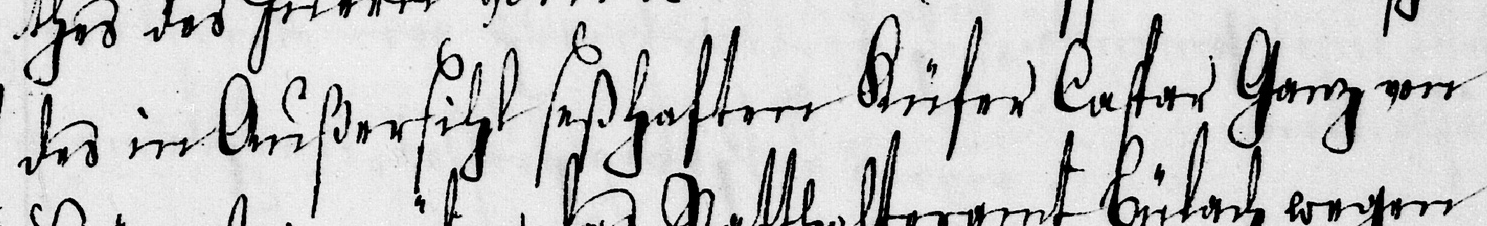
des in Außersihl seßhaften Küfer Caspar Ganz von
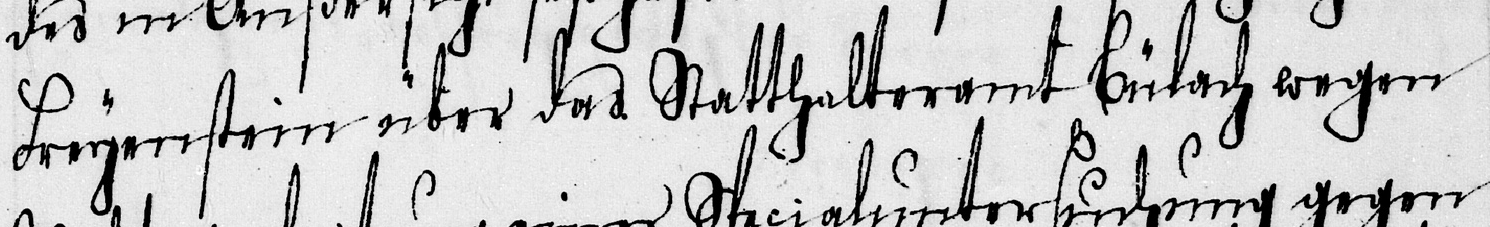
Freyenstein über das Statthalteramt Bülach wegen
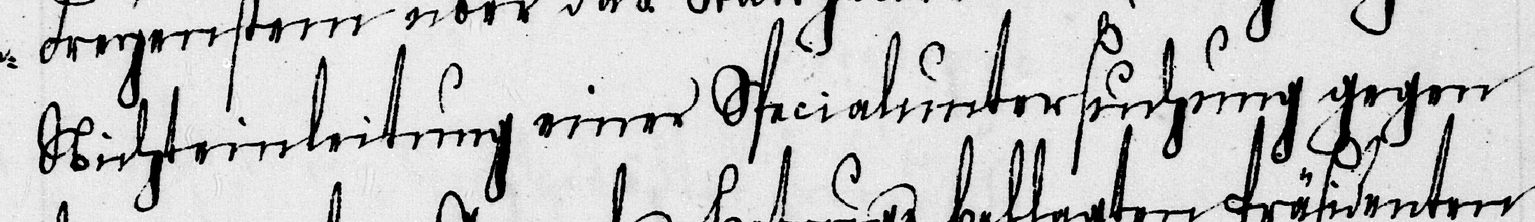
Nichteinleitung einer Specialuntersuchung gegen
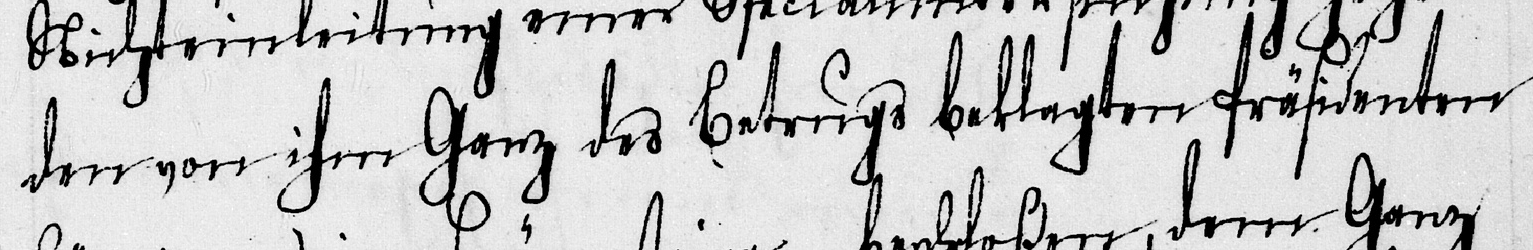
den von ihm Ganz des Betruges beklagten Präsidenten
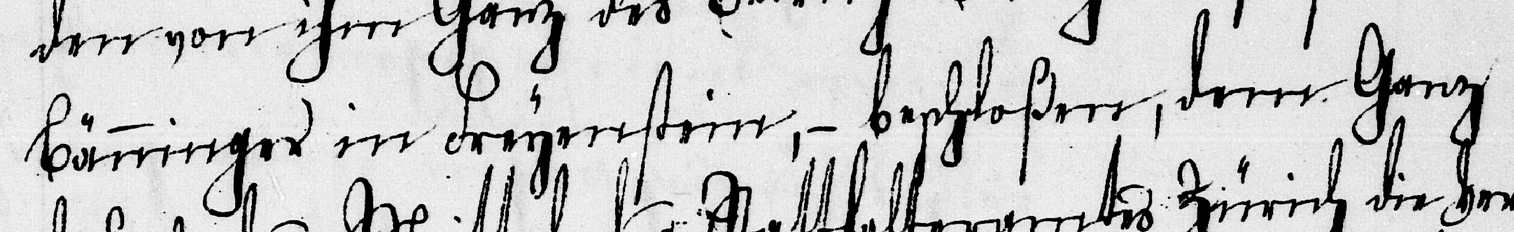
Bänninger in Freyenstein, – beschloßen, dem Ganz
